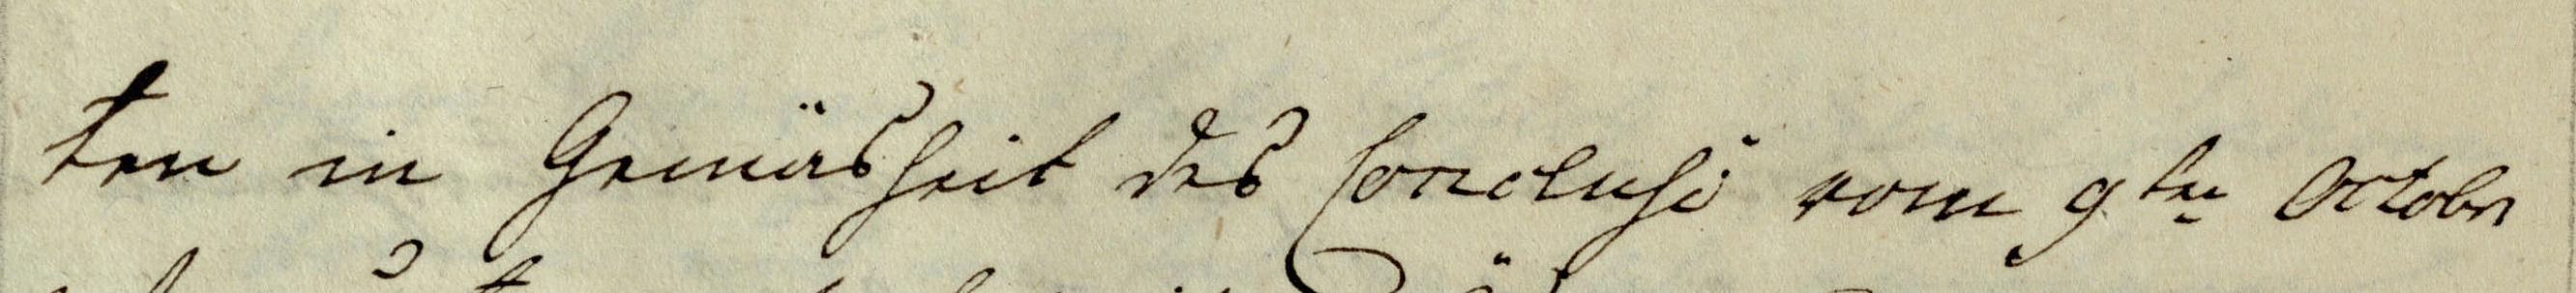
ten in Gemäsheit des Conclusi vom 9 ten Octobr.
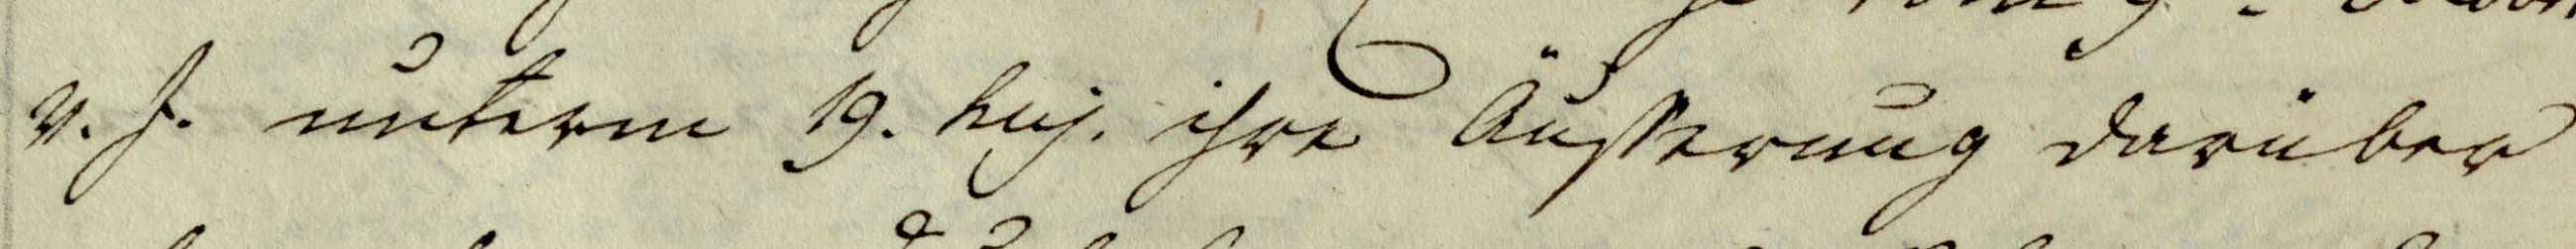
v. J. unterm 19. huj. ihre Äusserung darüber
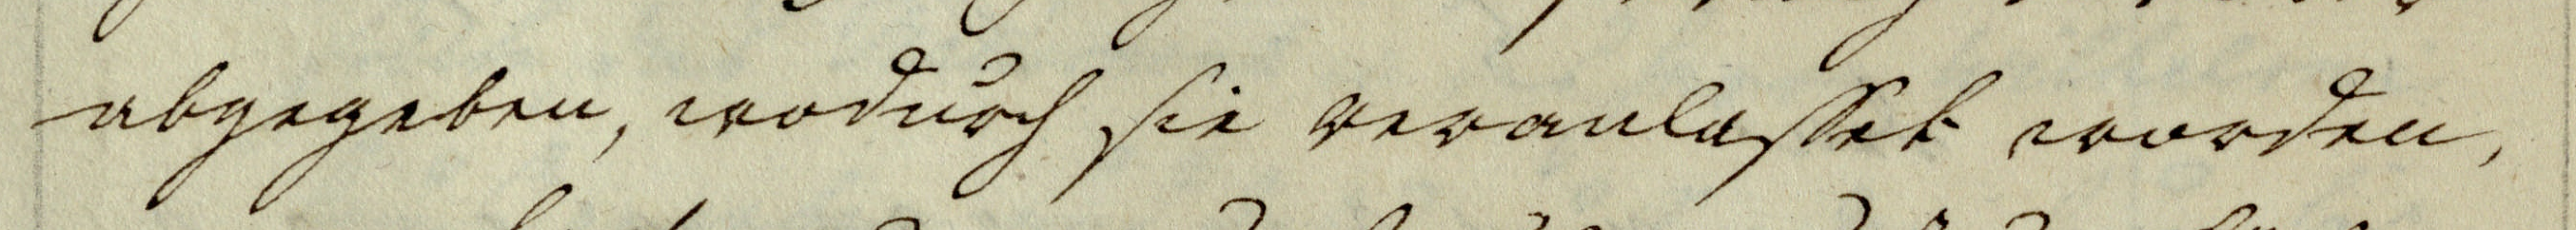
abgegeben, wodurch sie veranlasset worden,
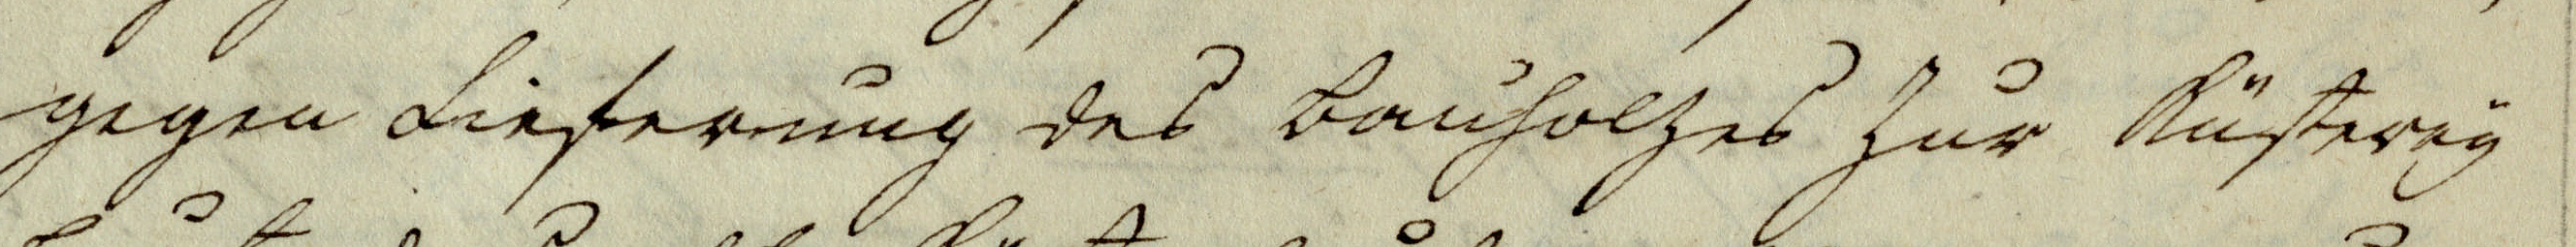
gegen Lieferung des Bauholzes zur Küstereÿ
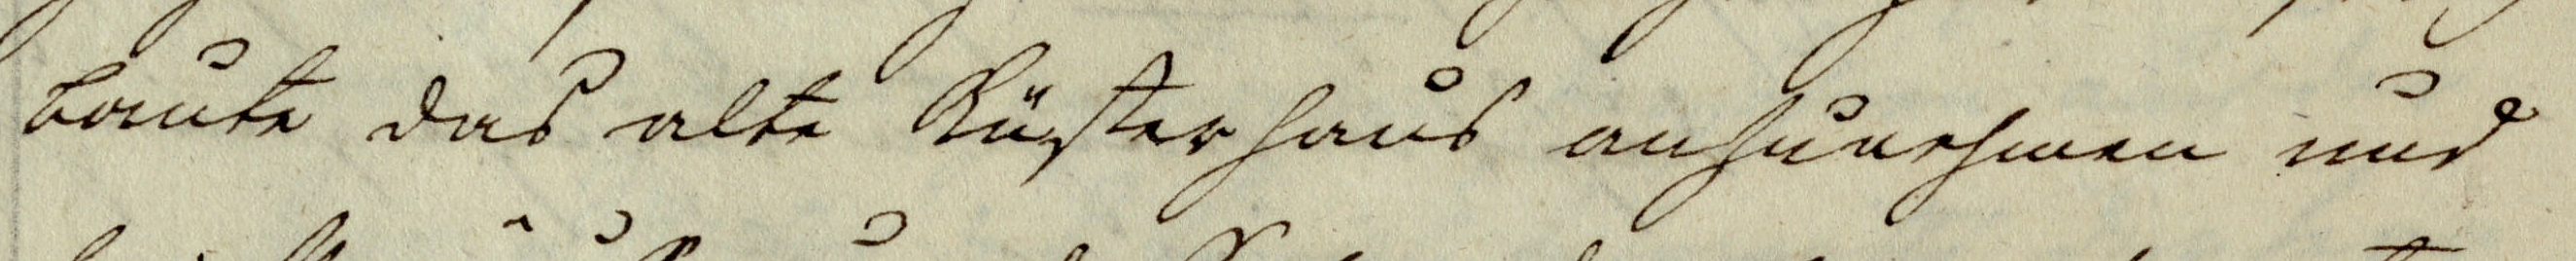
Baute das alte Küsterhaus anzunehmen und
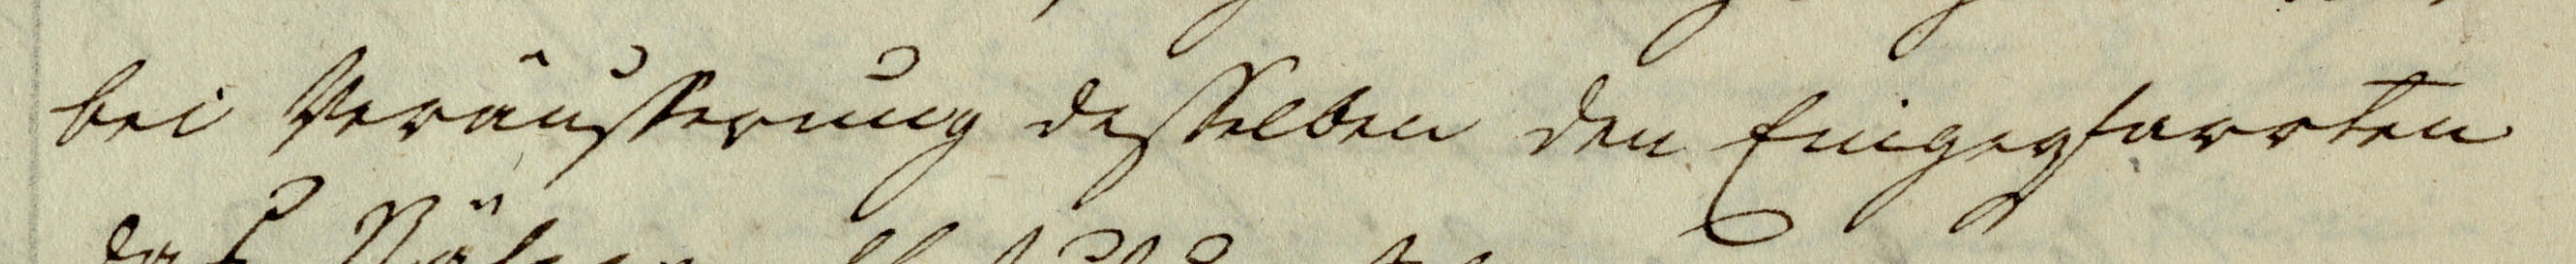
bei Veräusserung desselben den Eingepfarrten
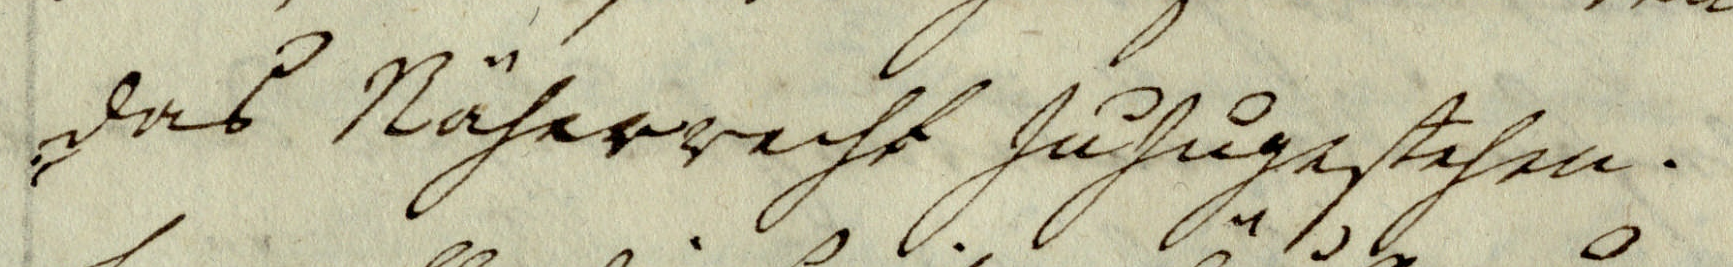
das Näherrecht zuzugestehen.
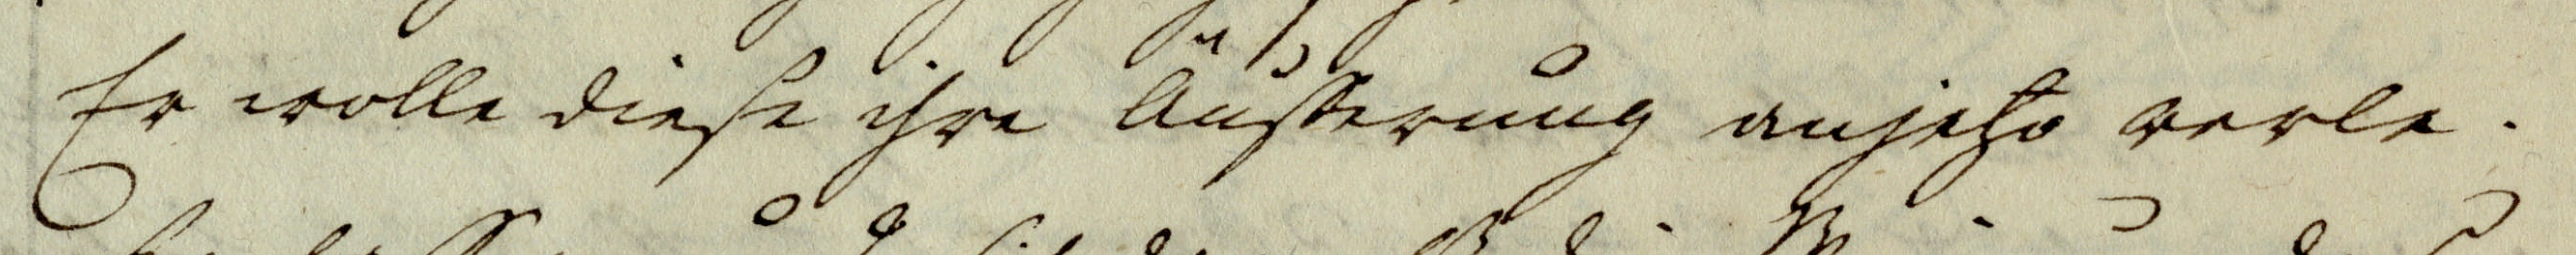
Er wolle diese ihre Äusserung anjetzo verle¬
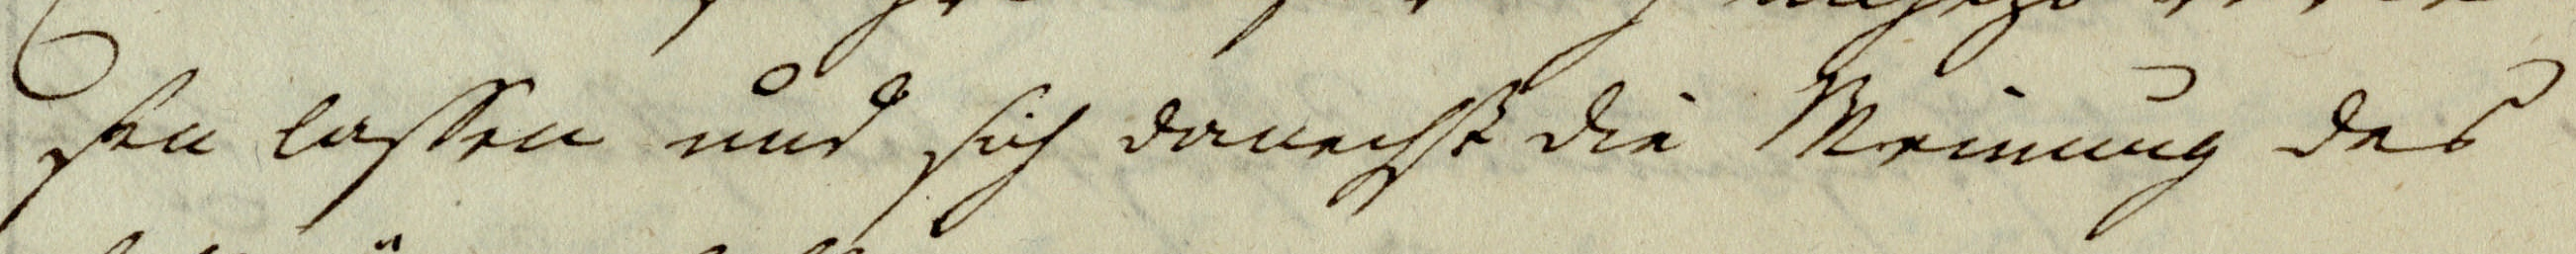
sen lassen und sich danechst die Meinung des
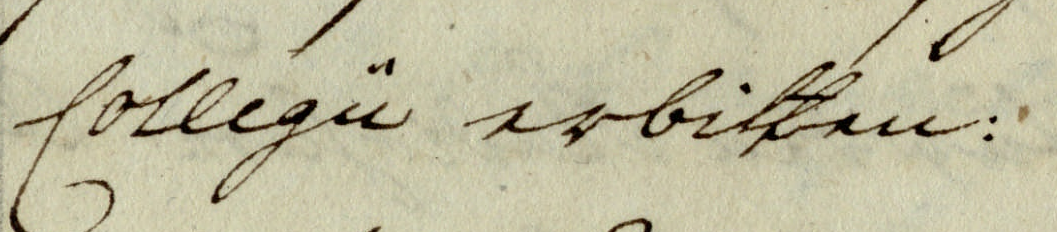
Collegii erbitten:
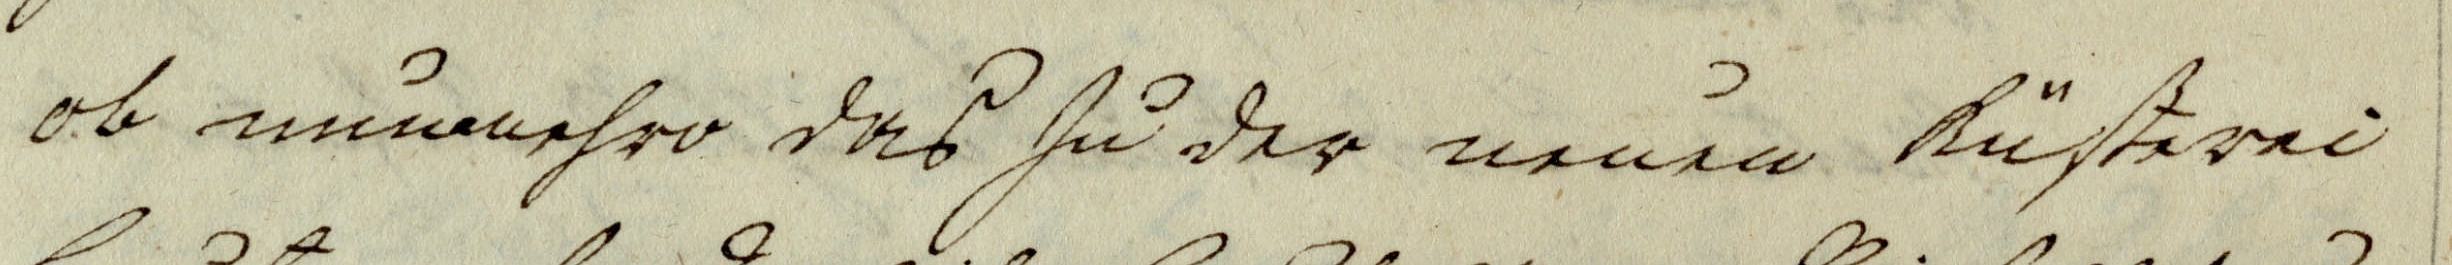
ob nunmehro das zu der neuen Küsterei
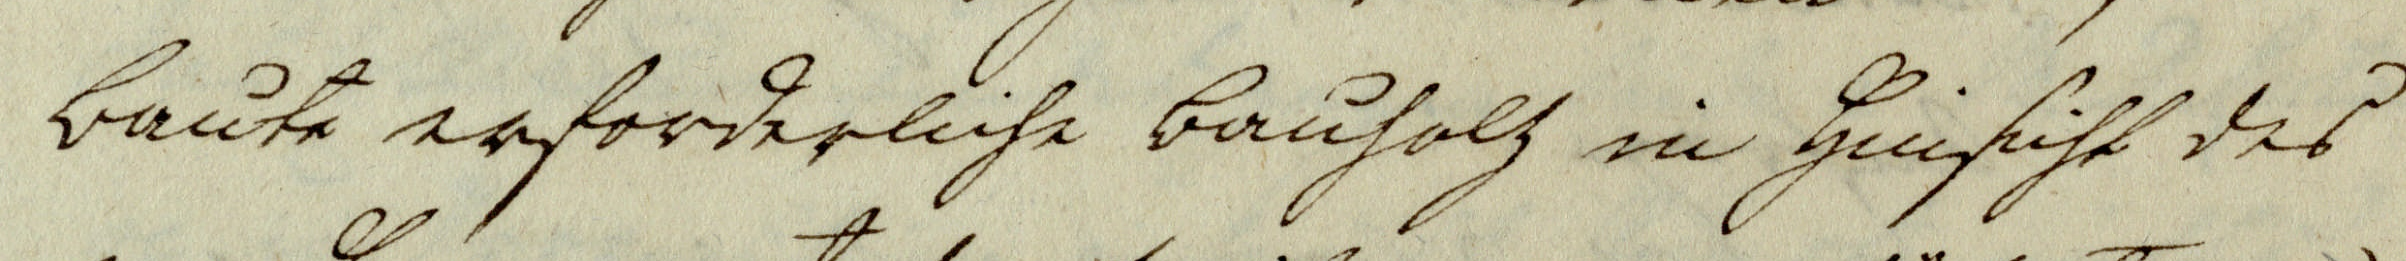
Baute erforderliche Bauholz in Hinsicht des
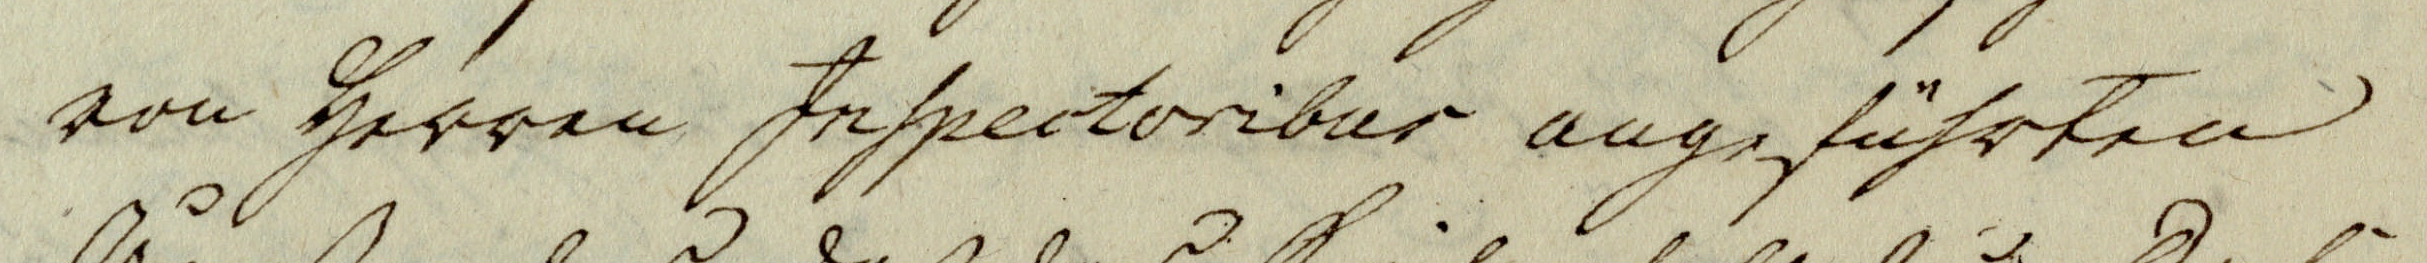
von Herren Inspectoribus angeführten
